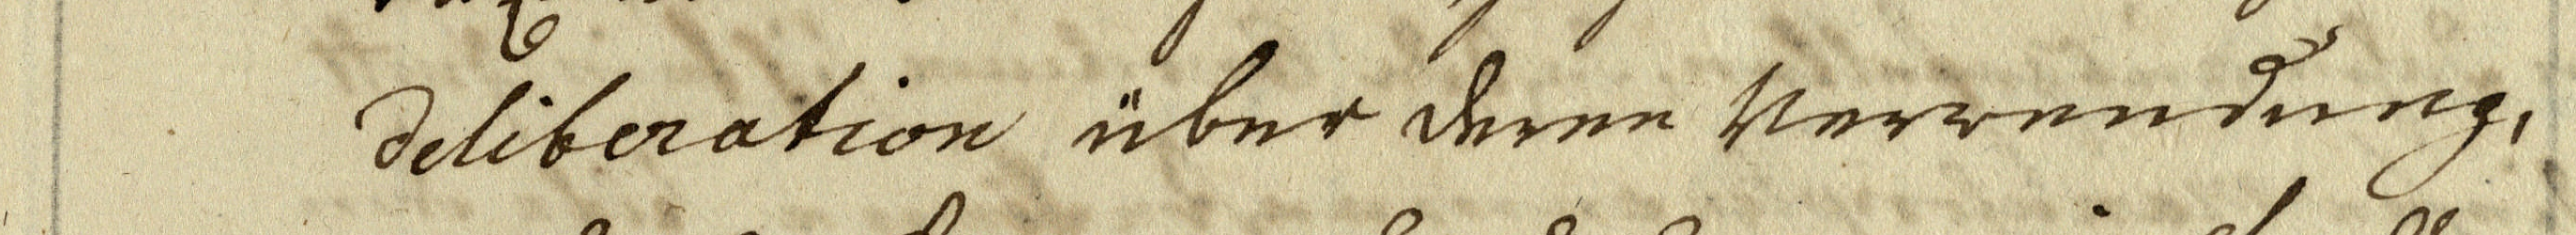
deliberation über deren Verwendung,
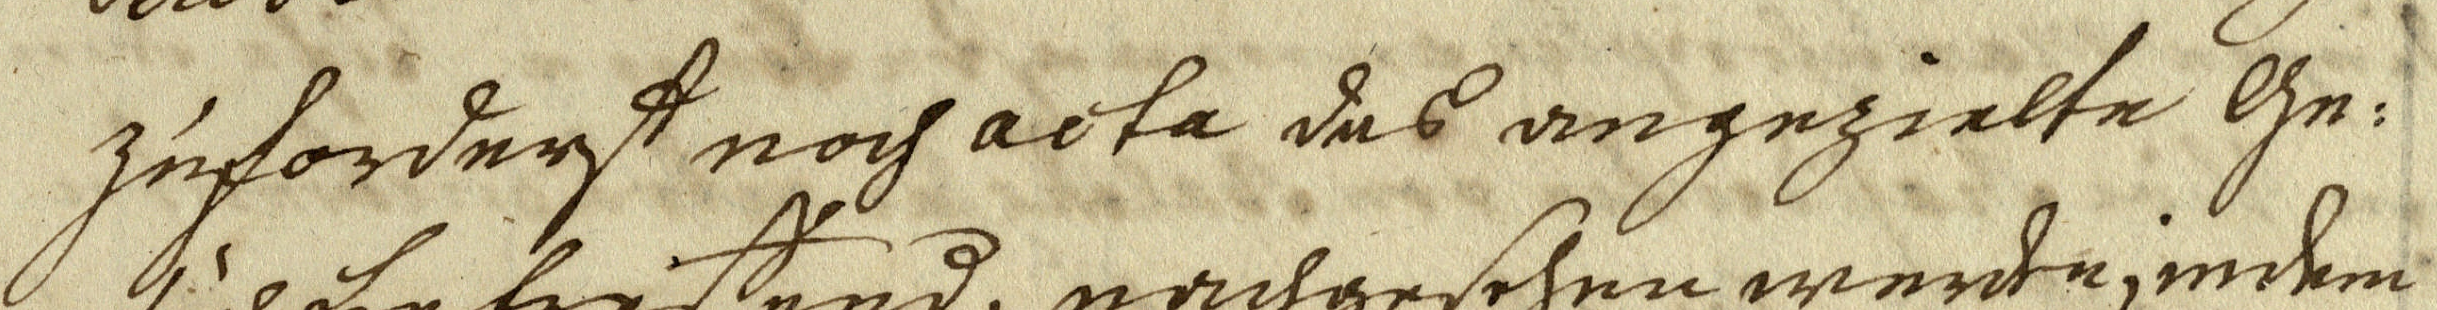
zuforderst noch acta das angezielte Ge¬
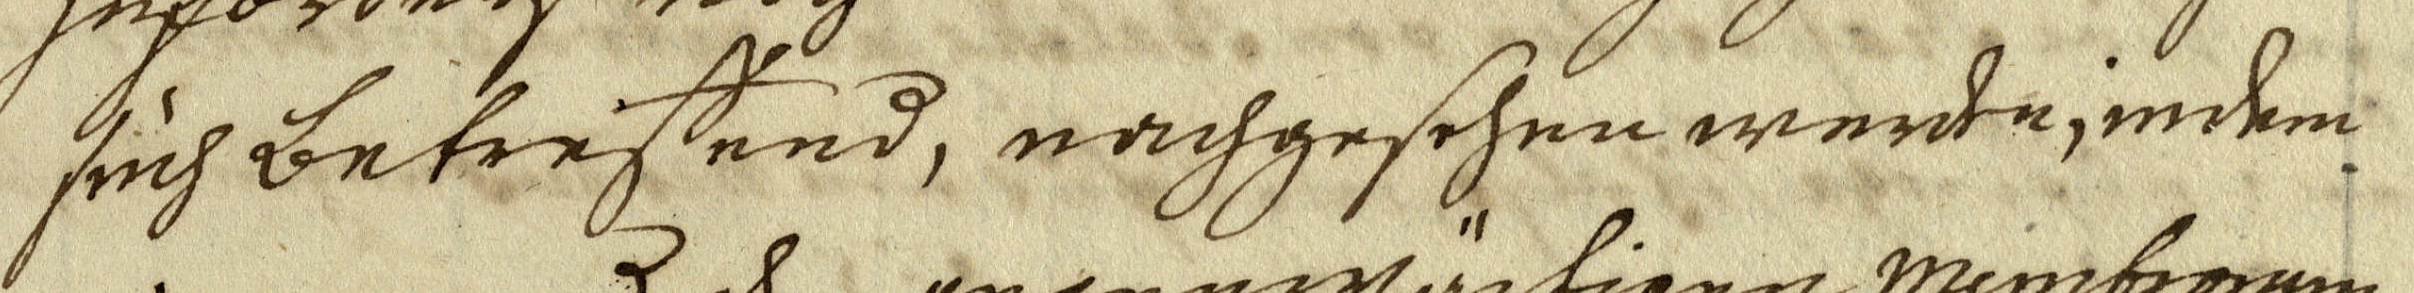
such betreffend, nachgesehen werden, indem
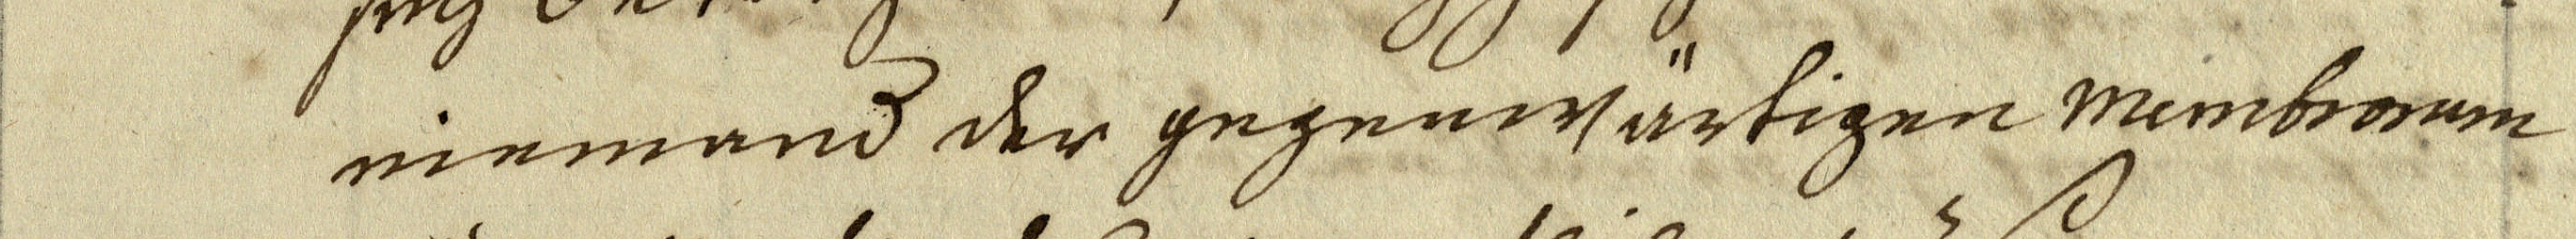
niemand der gegenwärtigen membrorum
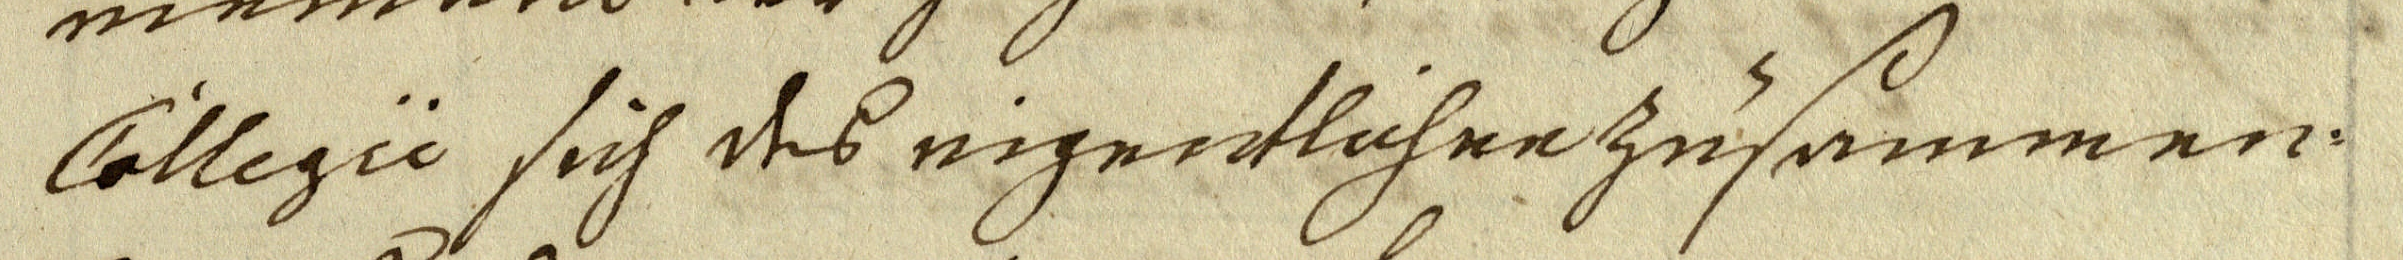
Collegii sich des eigentlichen Zusammen¬
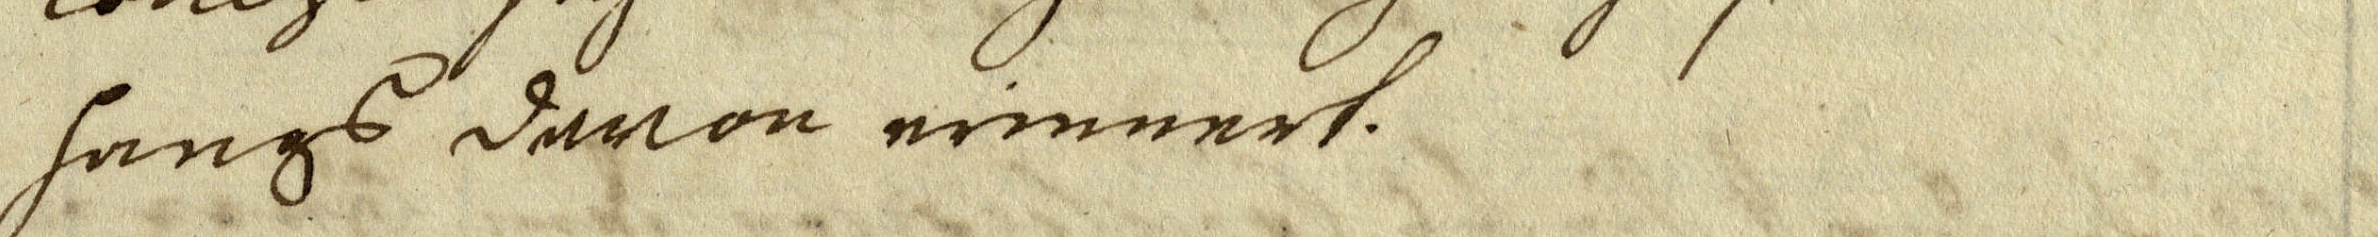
hangs davon erinnert.
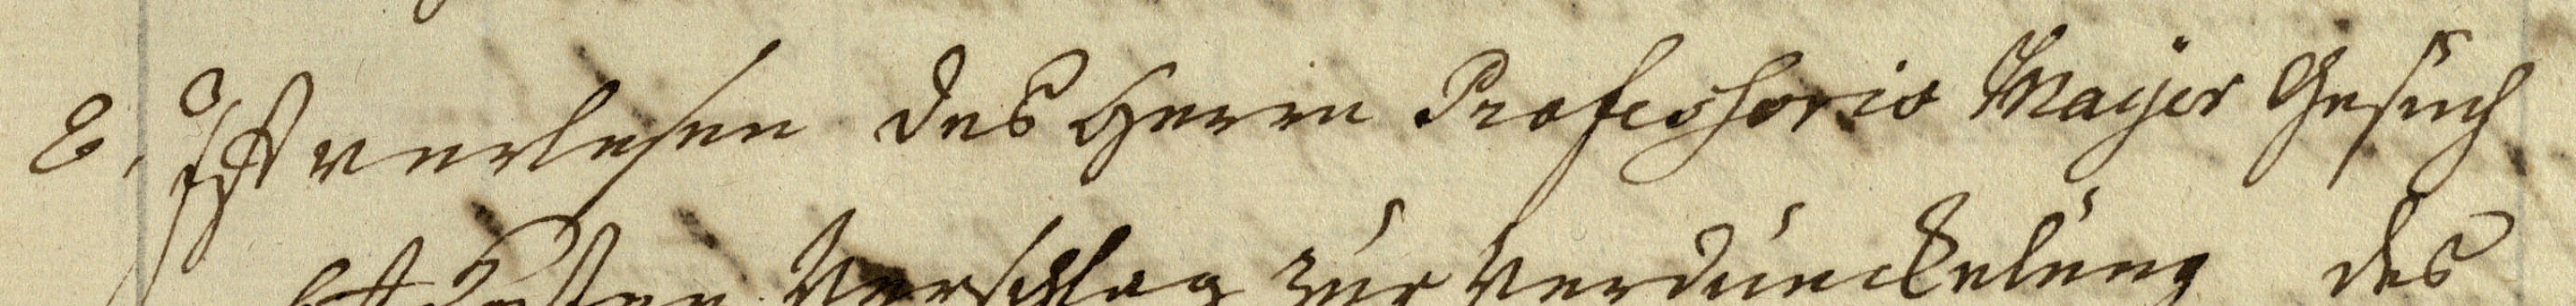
8. Ist verlesen des Herrn Professoris Maÿer Gesuch
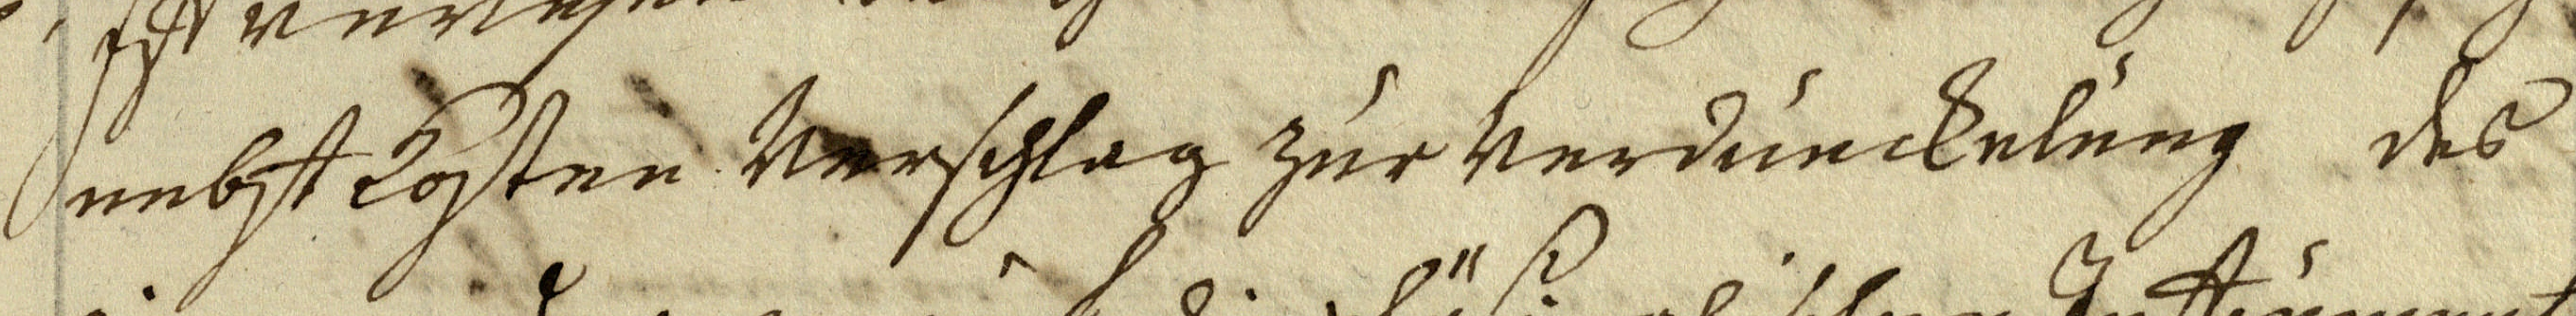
nebst Kosten Vorschlag zur Verdunckelung des
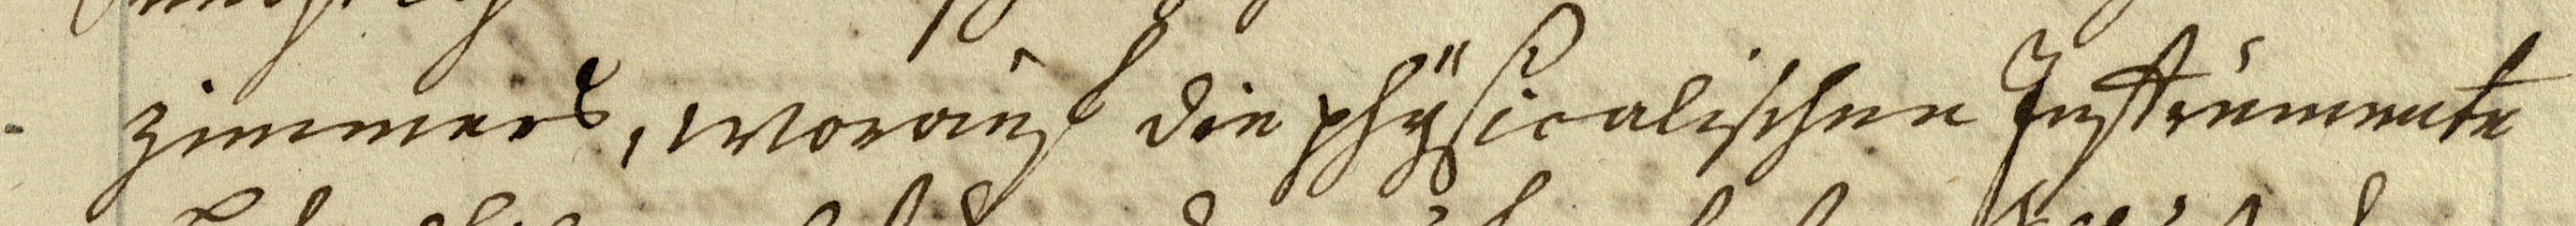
Zimmers, worauf die physicalischen Instrumente
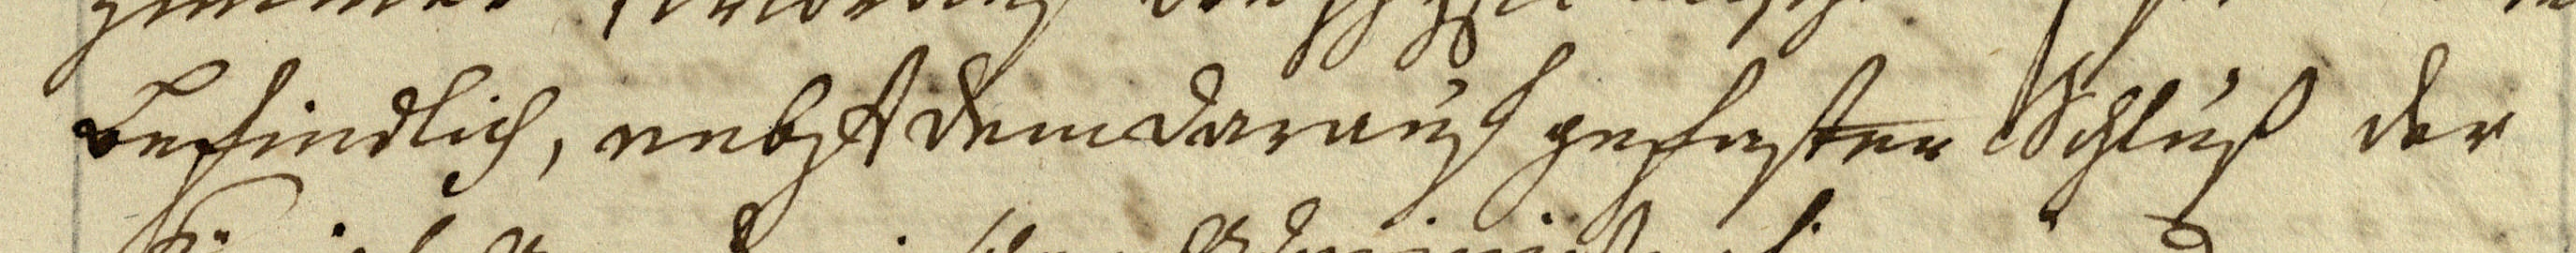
befindlich, nebst dem darauf gefasten Schluß der
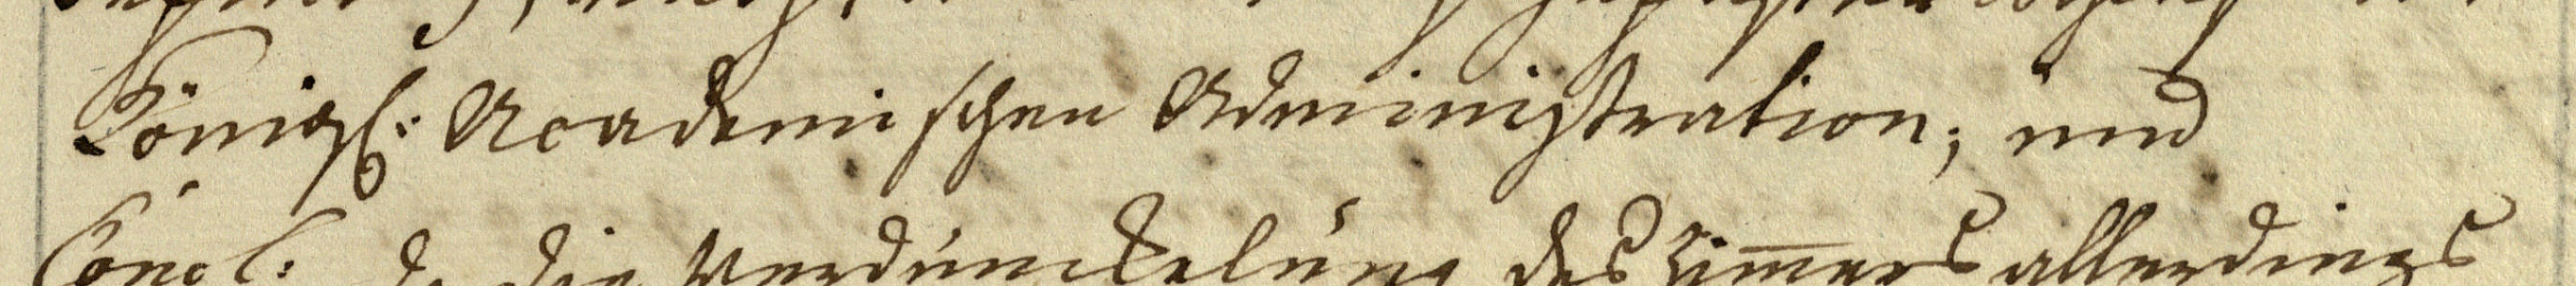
Königl. Academischen Administration; und
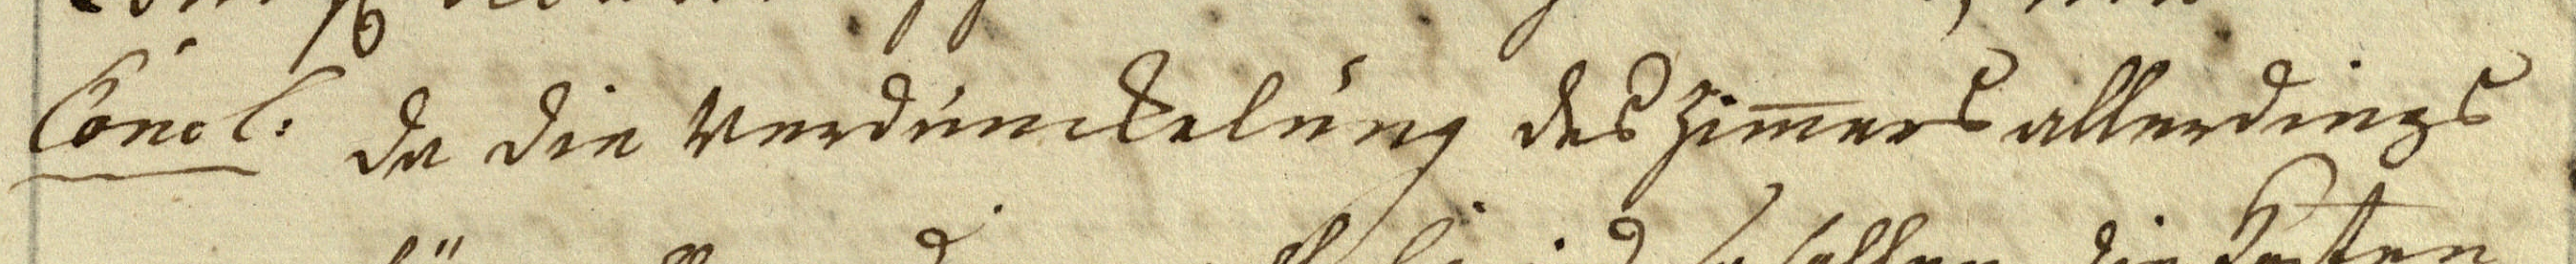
Concl. Da die Verdunckelung des Zimmers allerdings
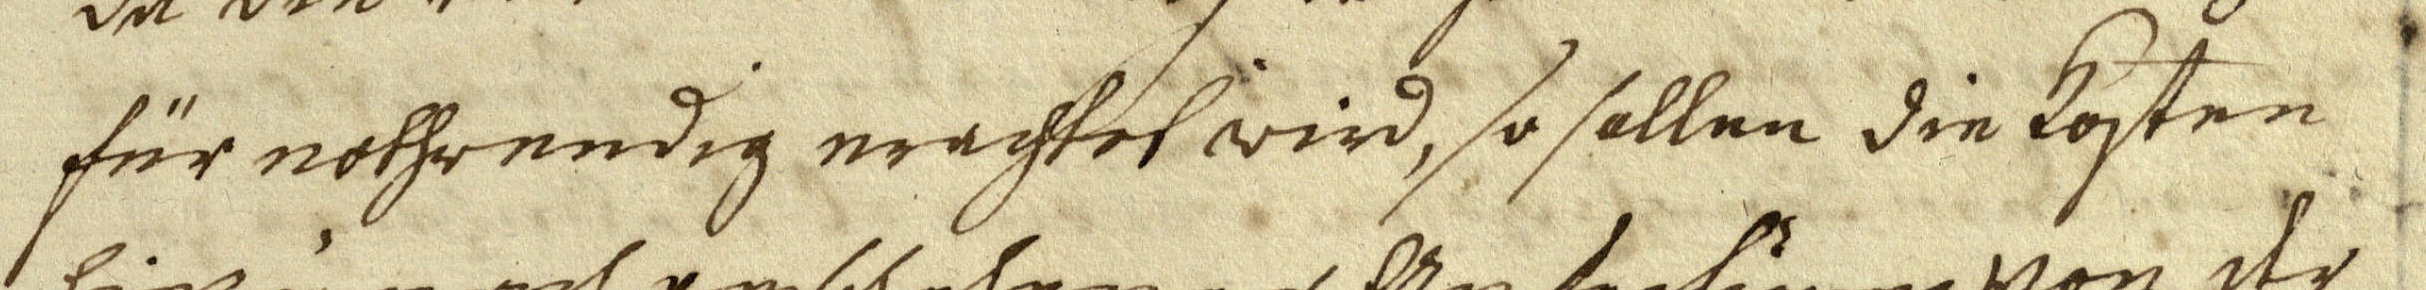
für nothwendig erachtet wird, so sollen die Kosten
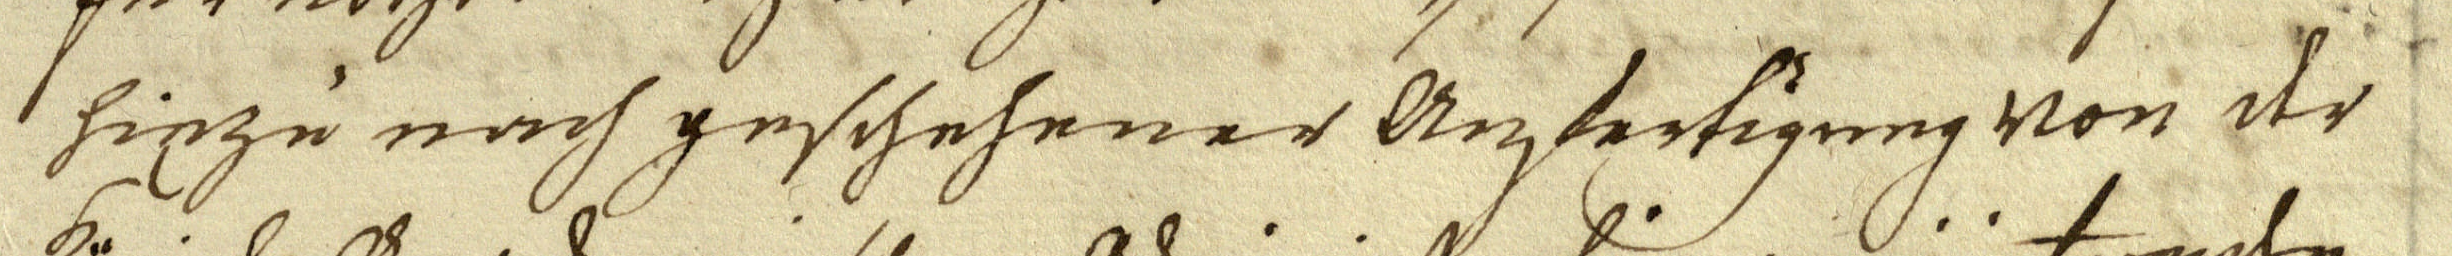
hiezu nach geschehener Anfertigung von der
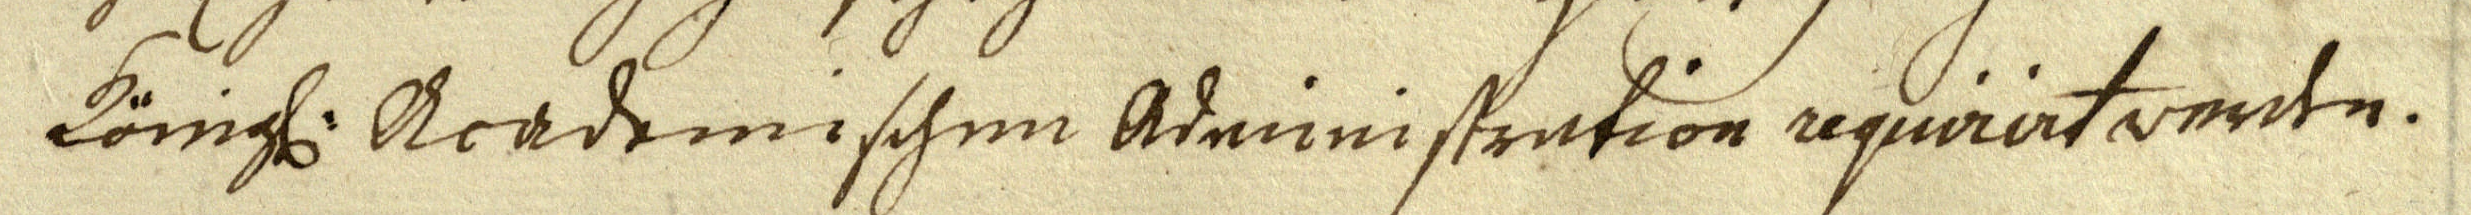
Königl. Academischen Administration requirirt werden.
